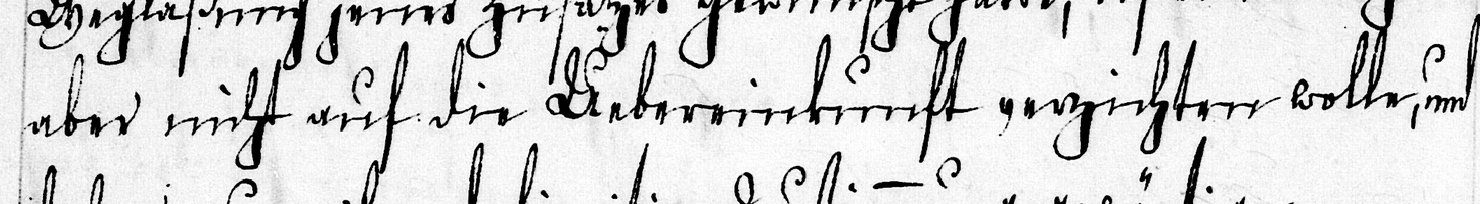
aber nicht auf die Uebereinkunft verzichten wolle,
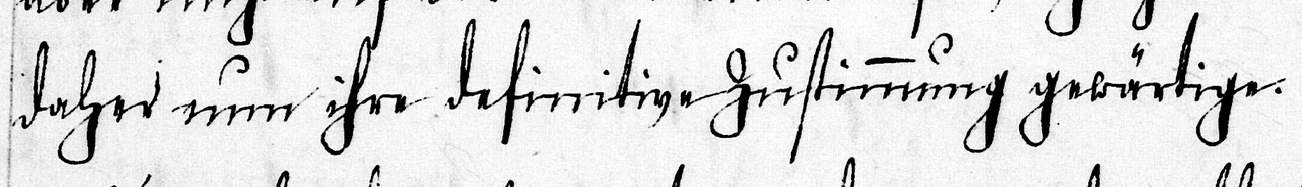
daher nun ihre definitive Zustimmung gewärtige.
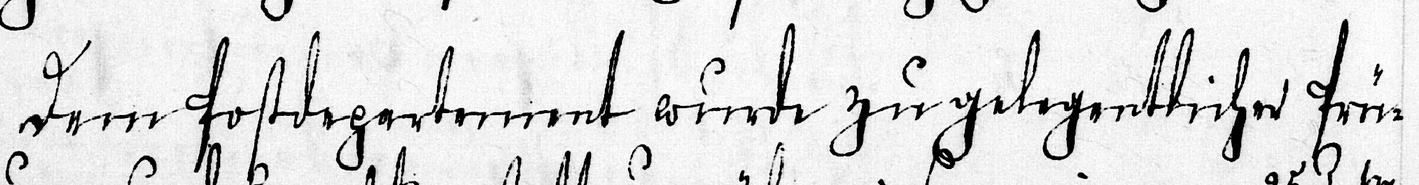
Dem Postdepartement wurde zu gelegentlicher Prü¬
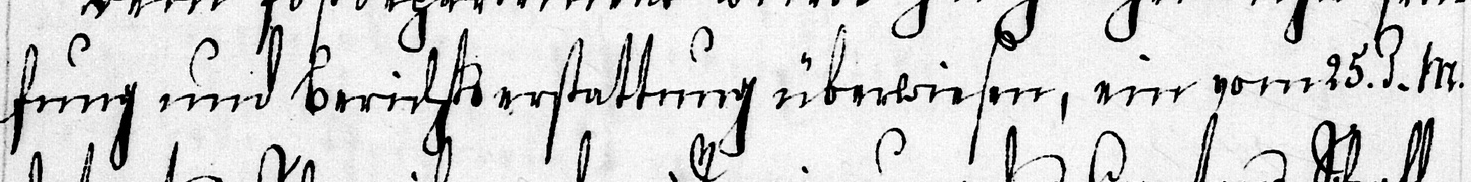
fung und Berichtserstattung überwiesen, ein vom 25. d. M.
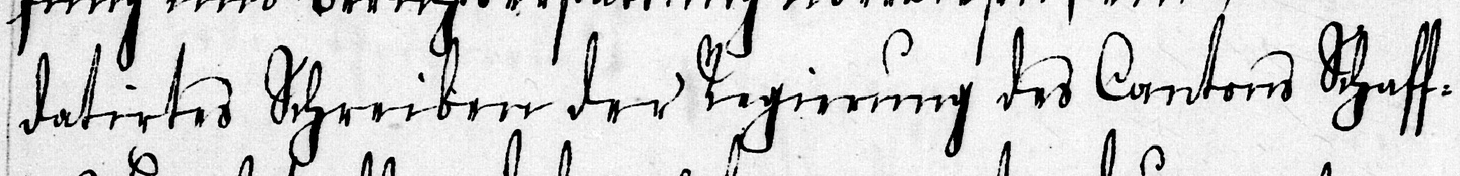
datirtes Schreiben der Regierung des Cantons Schaff¬
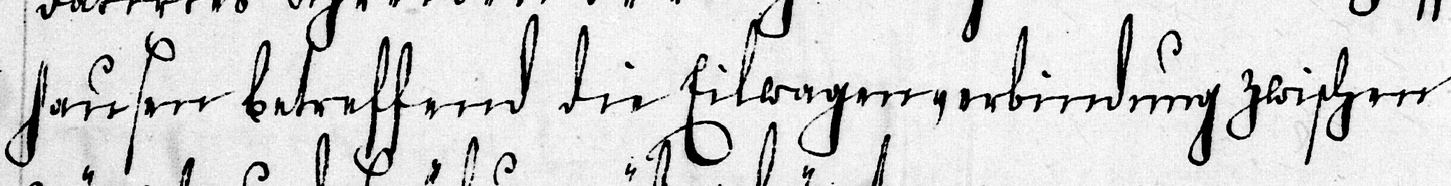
hausen betreffend die Eilwagenverbindung zwischen
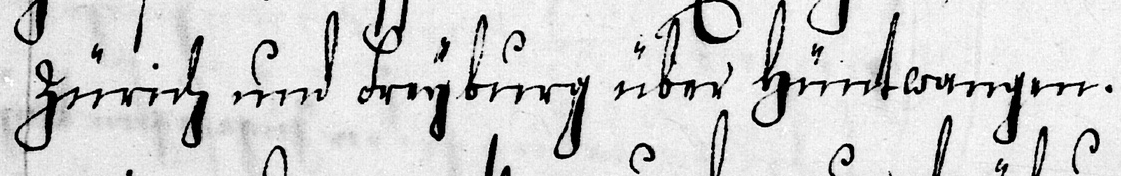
Zürich und Freyburg über Hüntwangen.
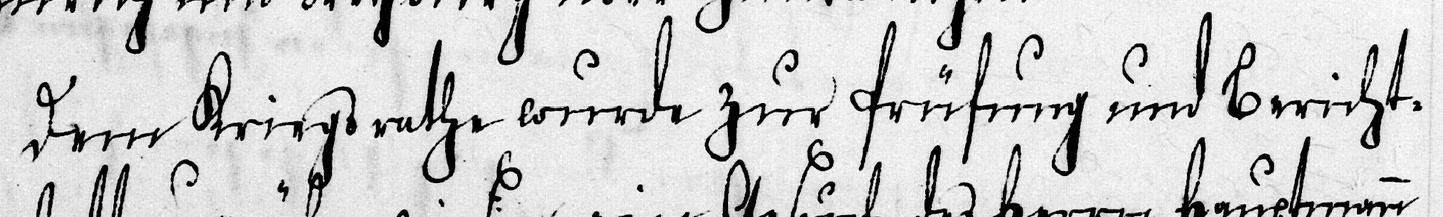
Dem Kriegsrathe wurde zur Prüfung und Bericht¬
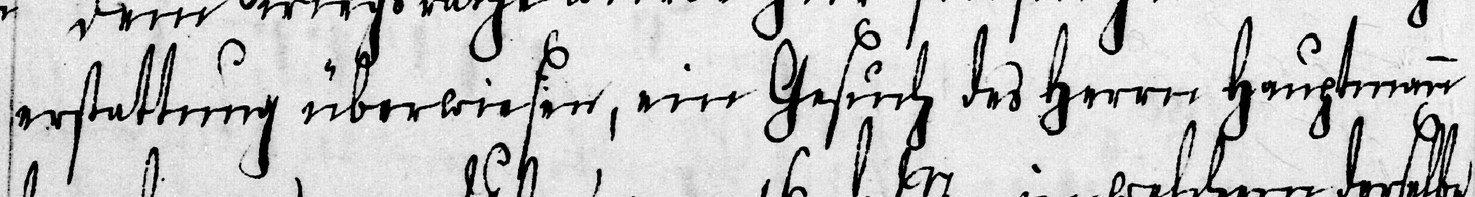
erstattung überwiesen, ein Gesuch des Herrn Hauptmann
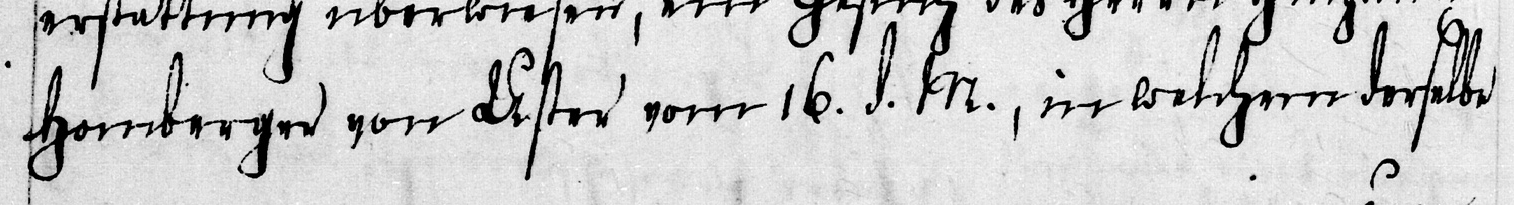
Homberger von Uster vom 16. d. M., in welchem derselbe
